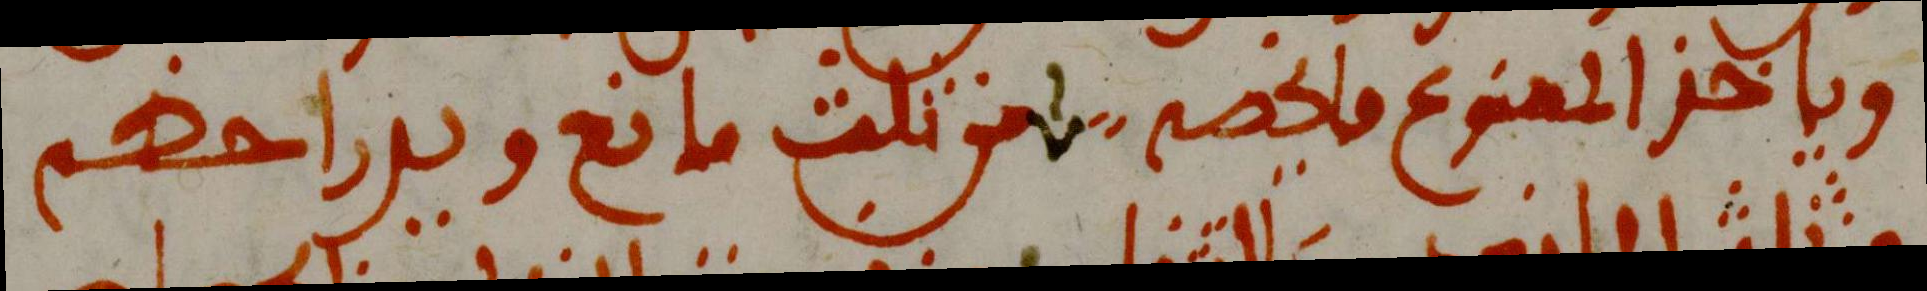وياخذ الممنوع ما يخصه من ثلث مانع ويدرا حظه
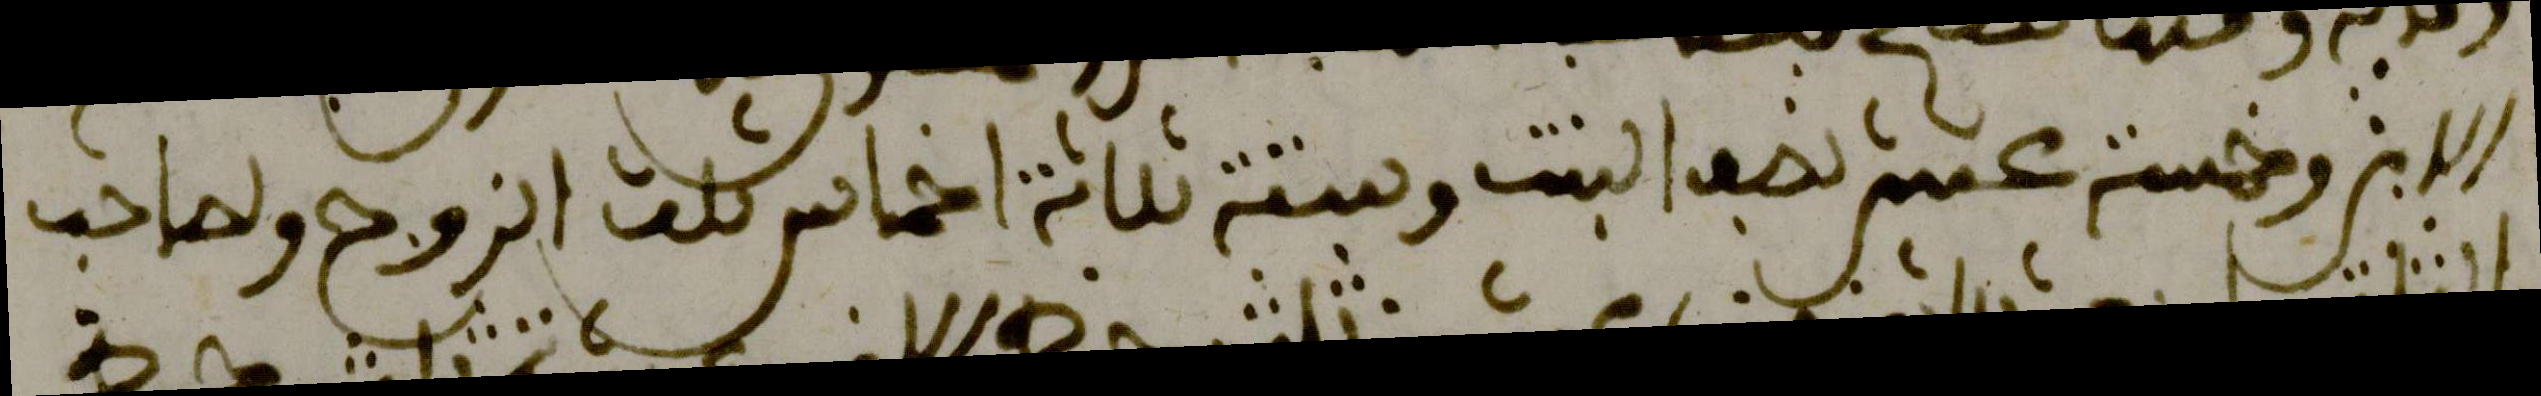الابن وخمسة عشر نصف البنت وستة ثلاثة اخماس ثلث الزوج ولصاحب
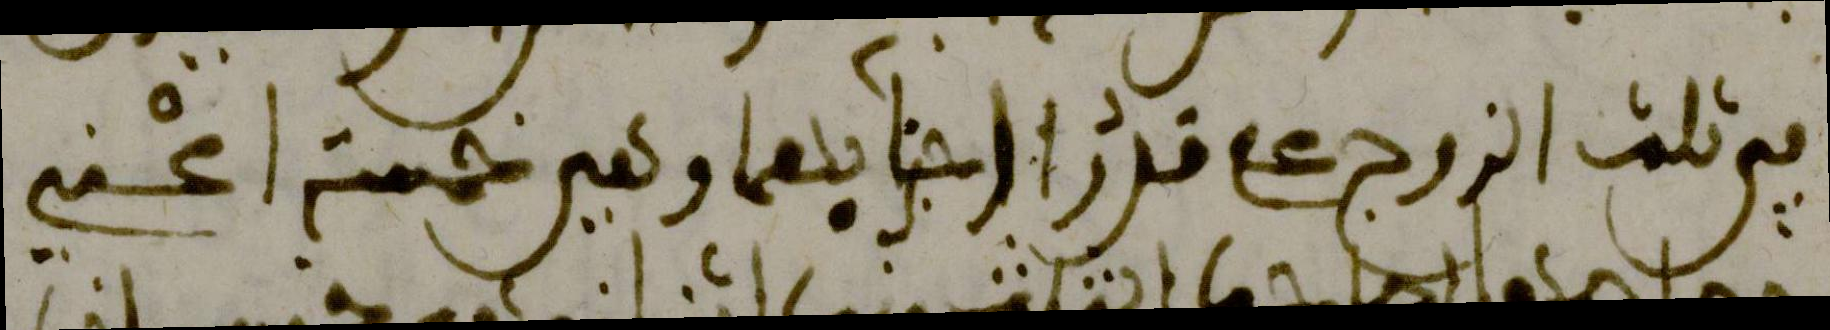في ثلث الزوج على قدر اجزائهما وهي خمسة اعني
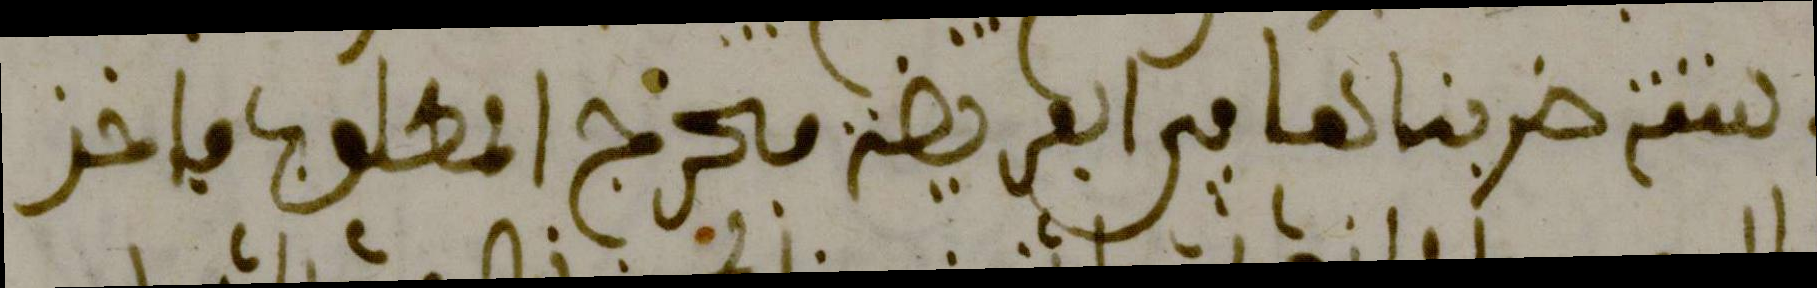ستة ضربناها في الفريضة فخرج المطلوب فاخذ
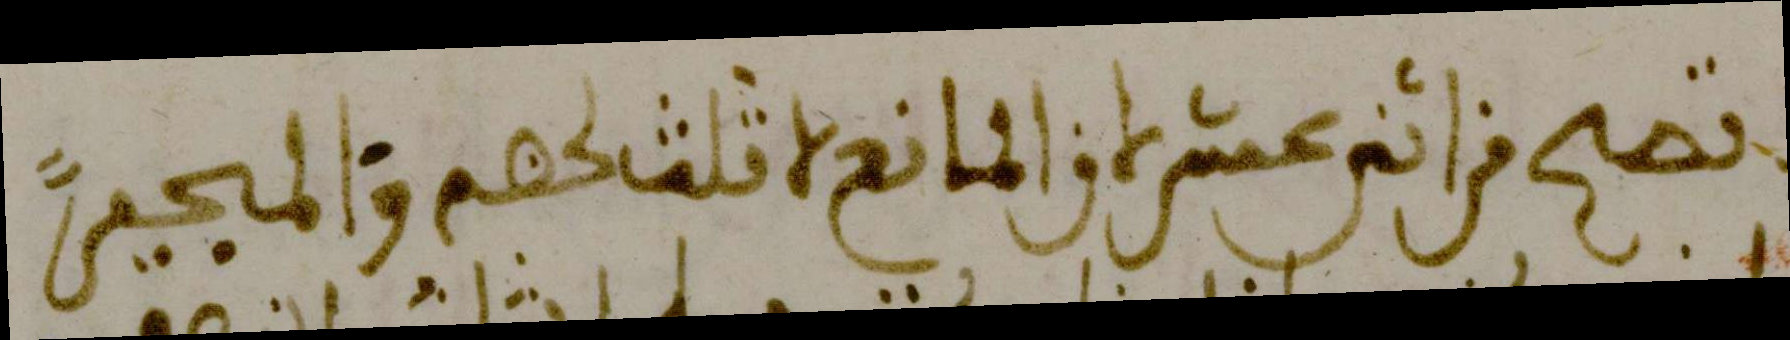تصح من اثنى عشر لان المانع لاثلث لحضه والمجير
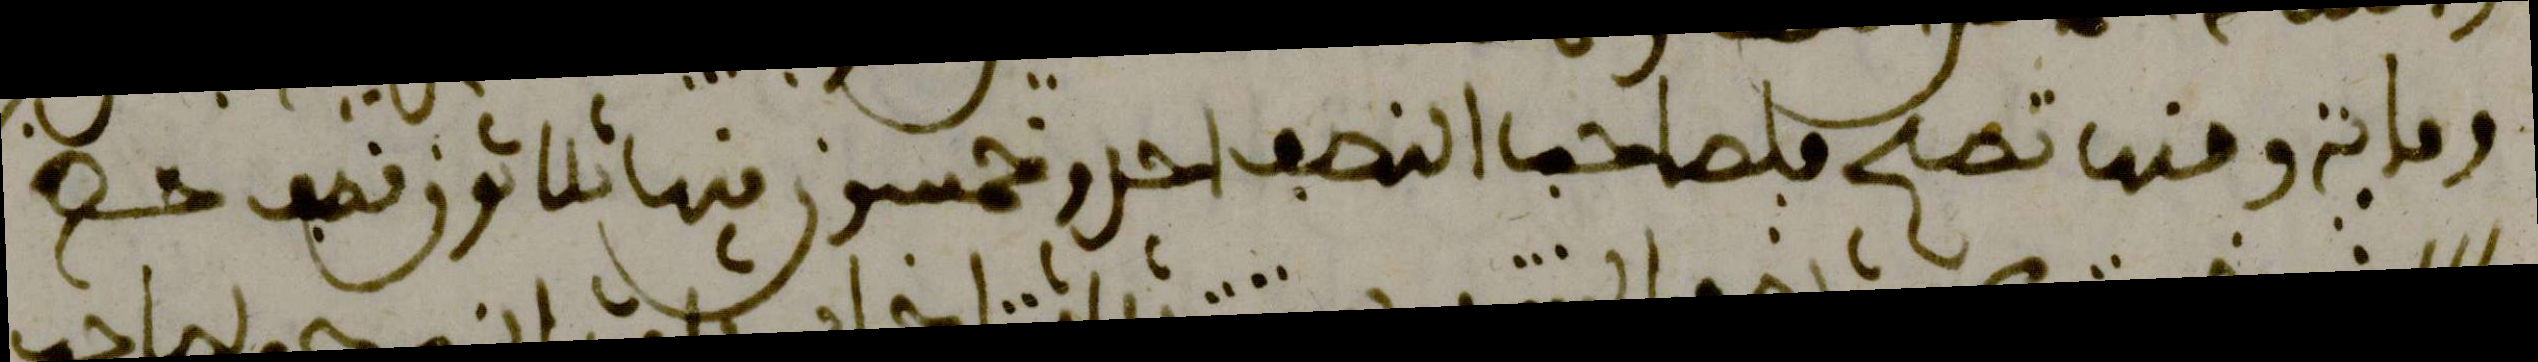وماية ومنها تصح فلصاحب النصف احد وخمسون منها ثلاثون نصف حظ
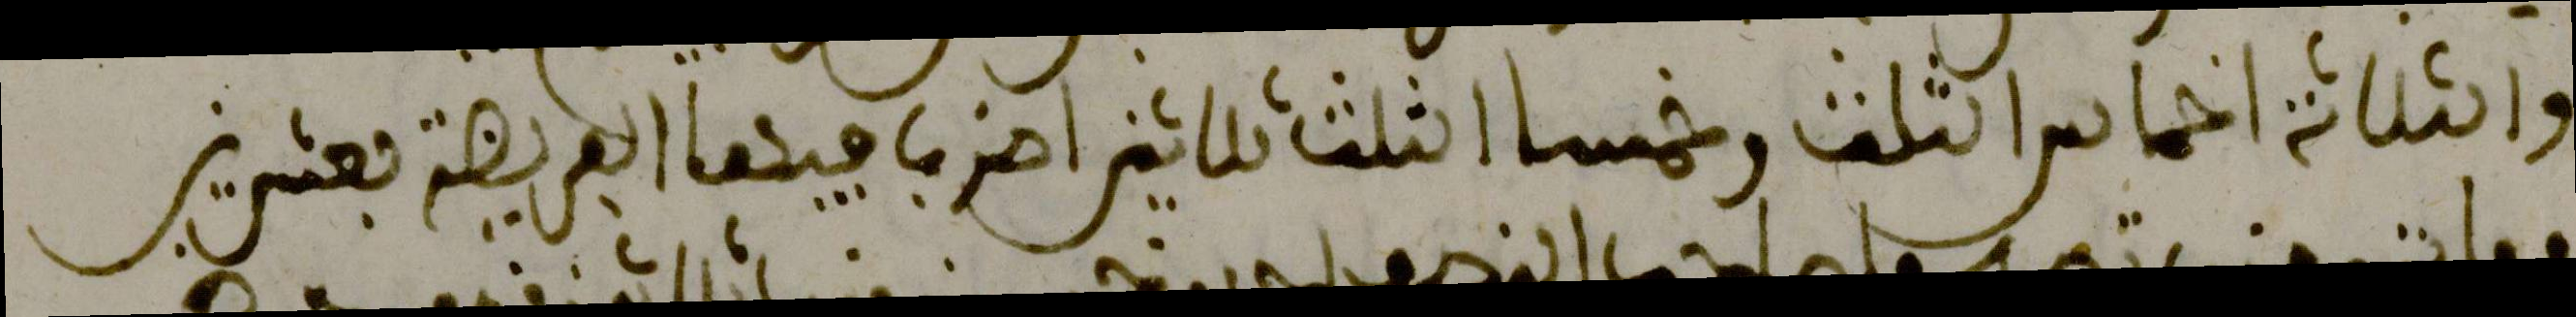والثلاثة اخماس الثلث وخمسا الثلث ثلاثين اضرب فيها الفريضة بعشرين
